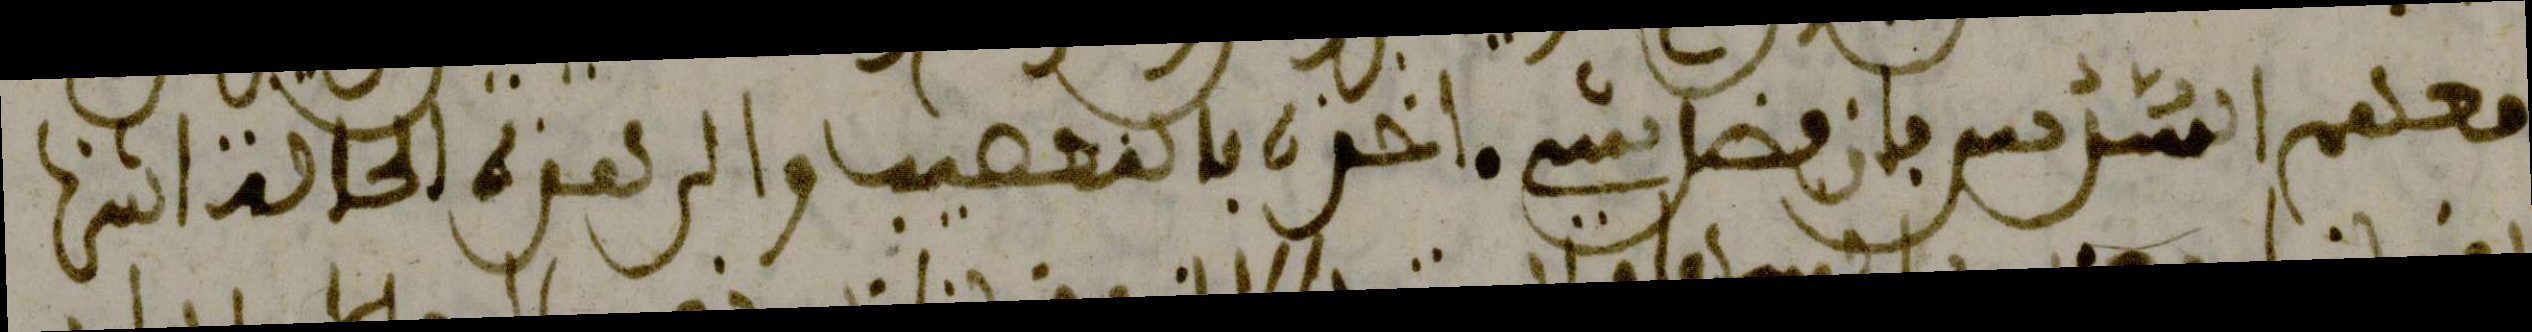معهم السدس فان فضل شيء اخذه بالتعصيب والى هذه الحالة اشرن
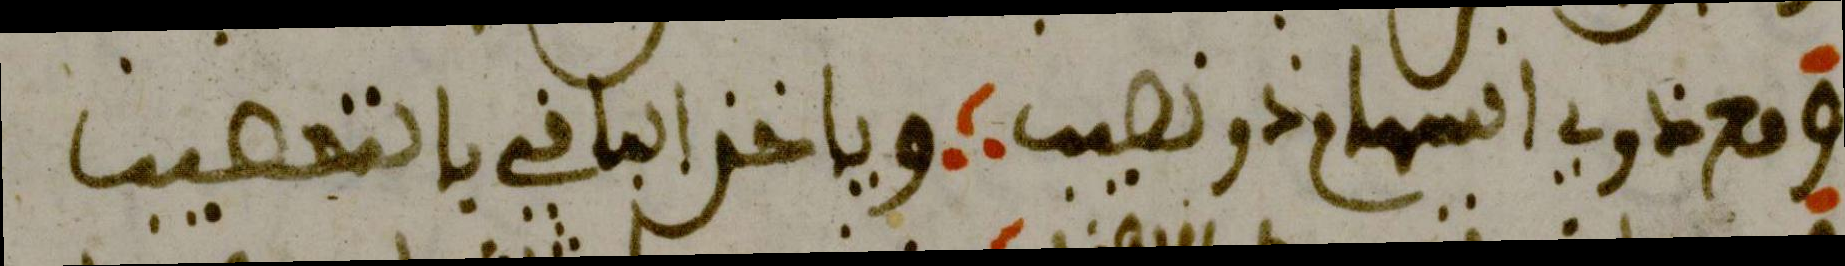وَمع ذوي السهام ذو نصيب وياخذ الباقي بالتعصيب
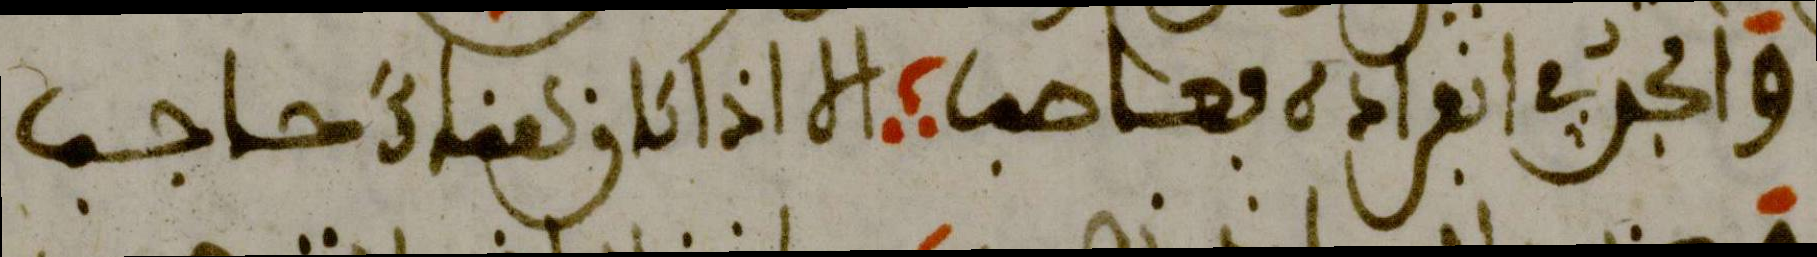وَالجد في انفراده فعاصب الا اذا كان هناك حاجب
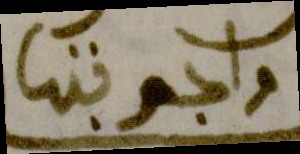واجوبتها
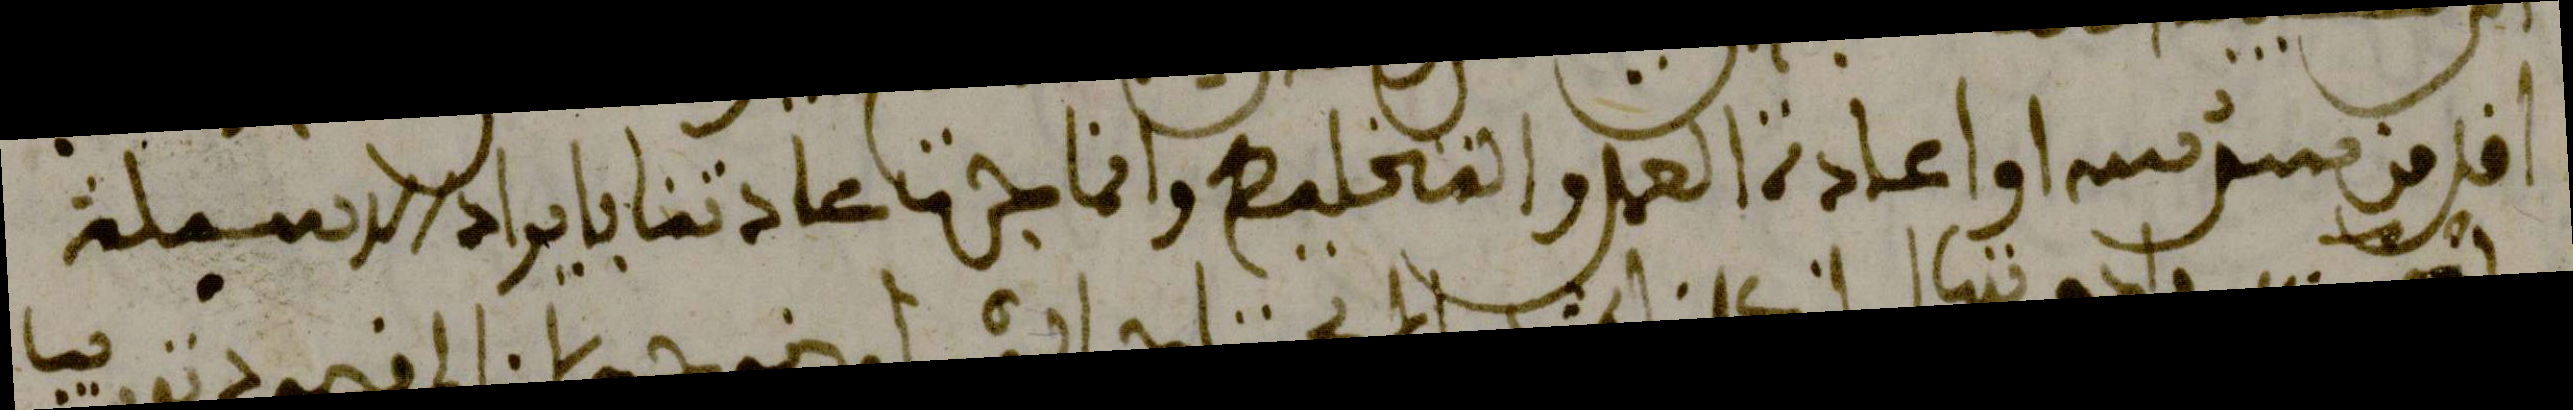اقل من سدسه او اعادة العمل والتخليط وانما جرت عادتنا بايراد الاسئلة
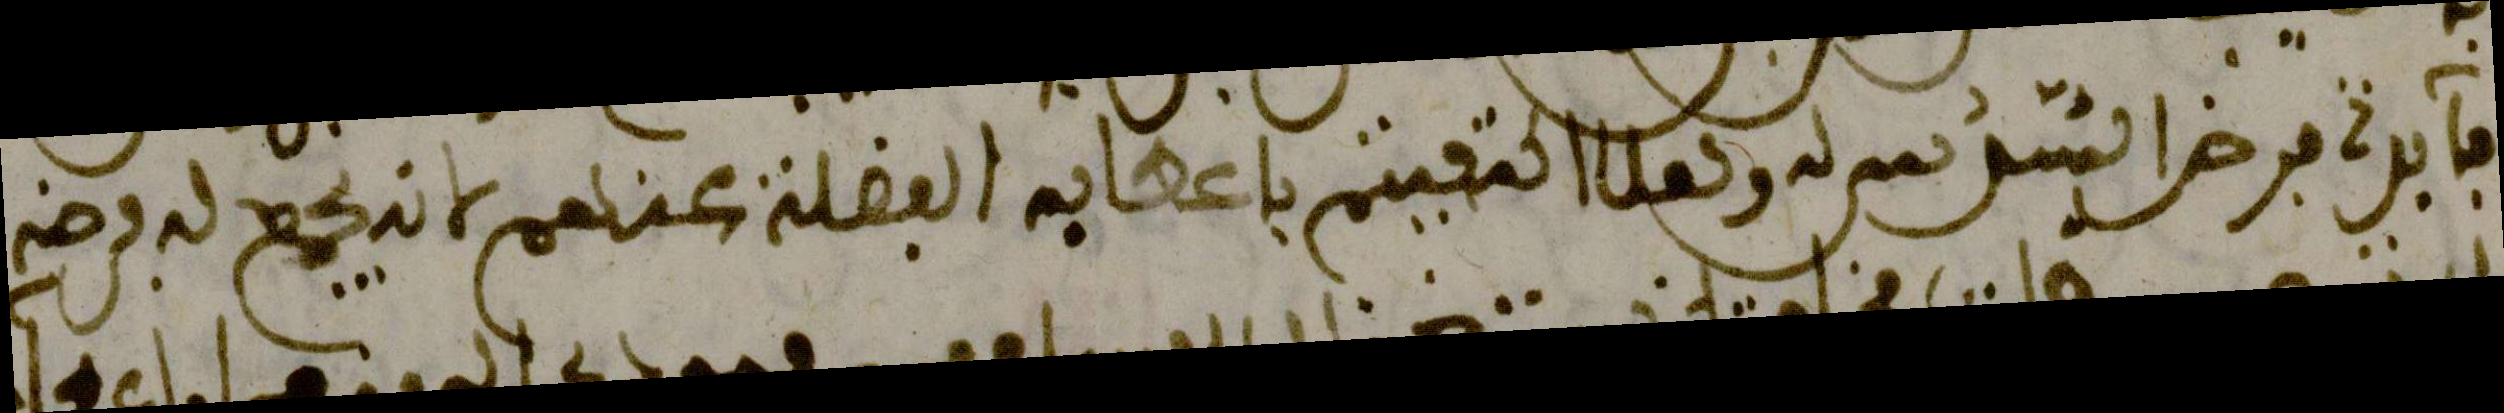فائدة فرض السدس له وهلا اكتفيتم باعطائه الفضلة عنهم لانه يجمع له فرضه
